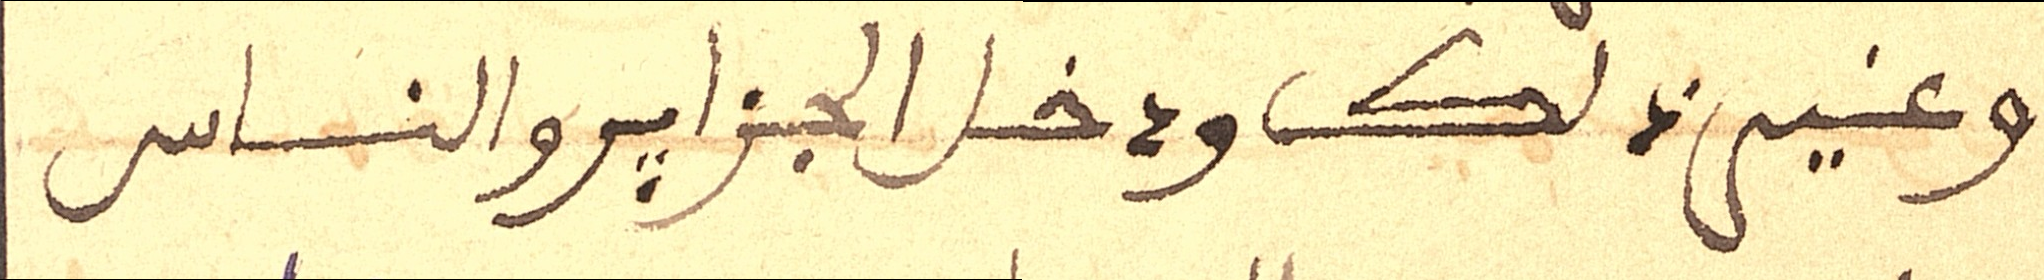وغير ذلك ودخل الجزائر والناس
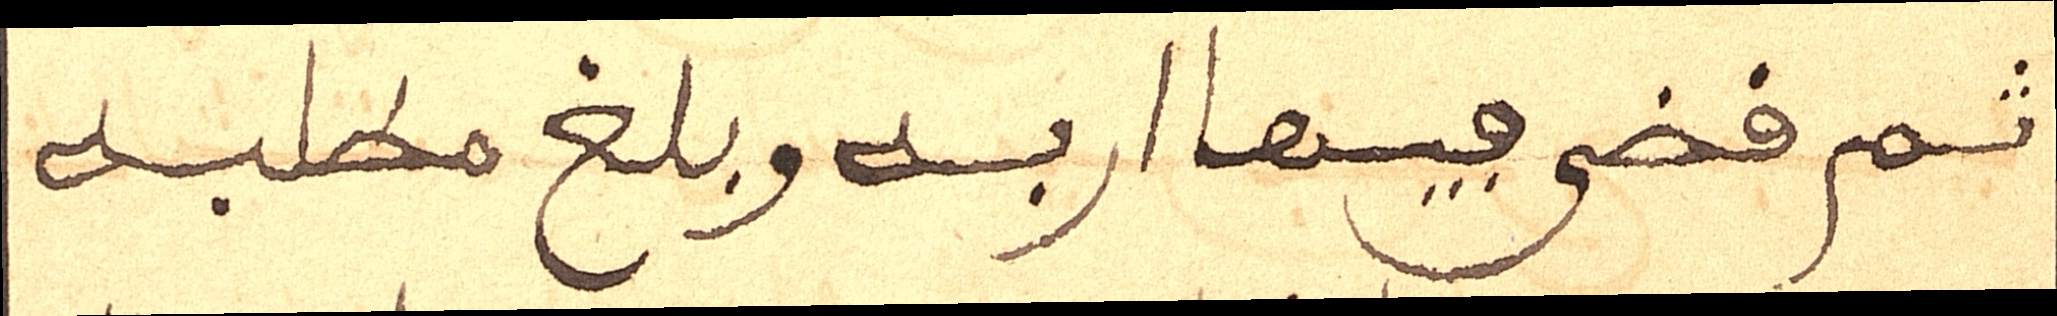ثم قضى فيها اربه وبلغ مطلبه
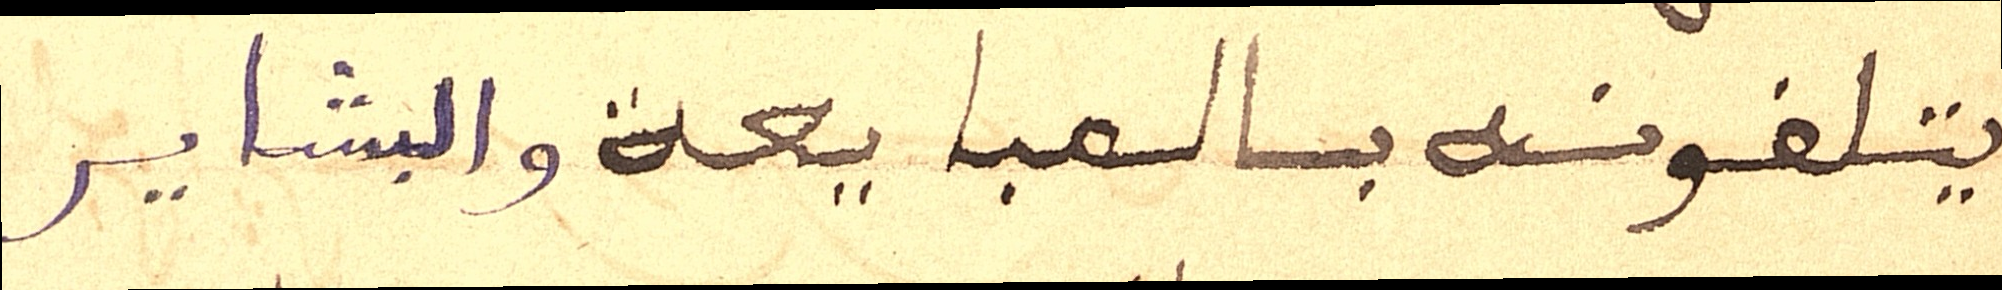يتلقونه بالمبايعة والبشاير
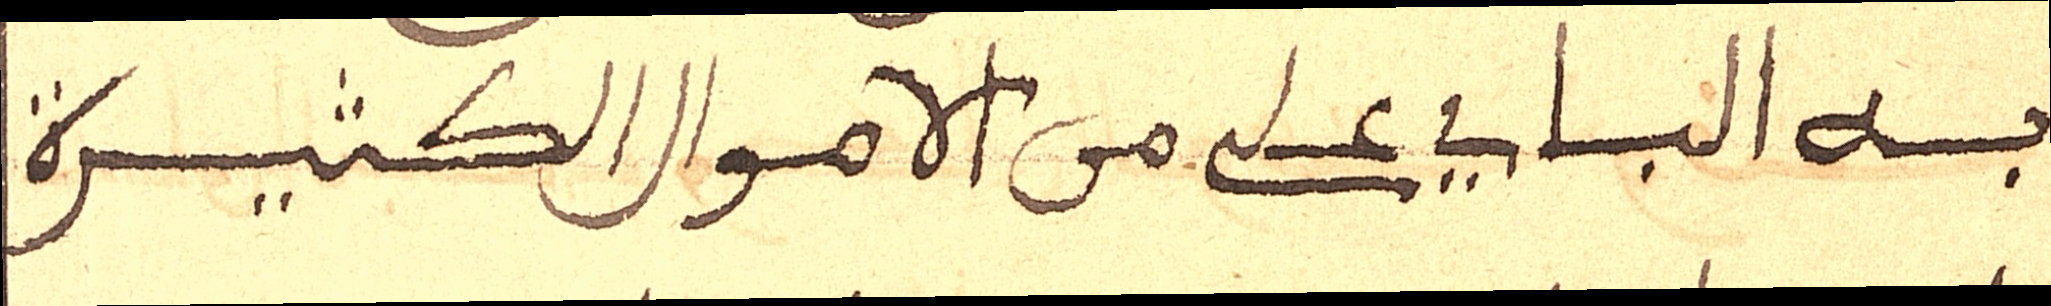به الباي على من الاموال الكثيرة
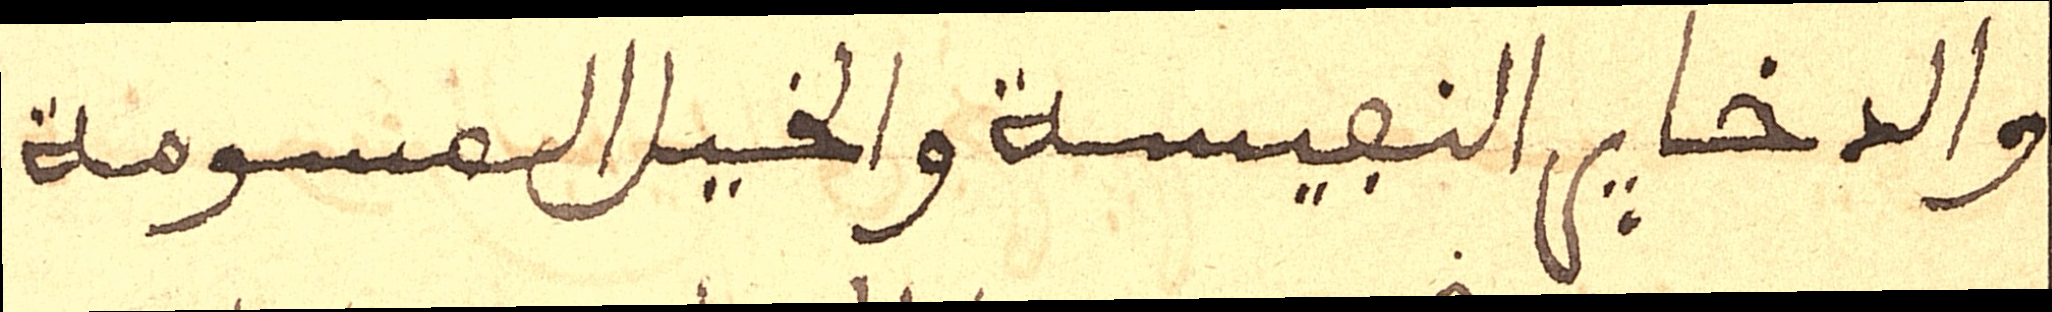والدخائر النفيسة والخيل المسومة
